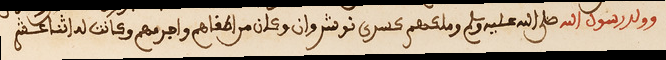وولد رسول الله صلى الله عليه وسلم وملكهم كسرى نوشروان وكان من اطغاهم واجرمهم وكانت له اثنا عشر
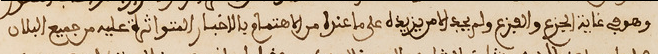وهو في غاية الجزع والفزع ولم يجد الامن يزيده على ما عنده من الاهتمام بالاخبار المتواثرة عليه من جميع البلان
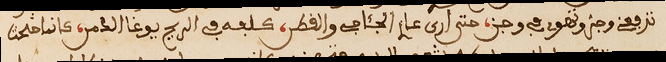ترفعنى وجر وتهوى في وجن حتى ارى عارى الجئاجى والقطن كلفه في الريح يوغا الدمن كانما خنحت
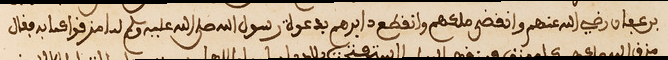بن عفان رضي الله عنهم وانقضى ملكهم وانقطع دابرهم بدعوة رسول الله صلى الله عليه وسلم له امز قوا كما به فقال
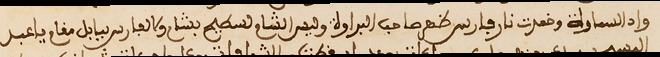واد السماوة وخمدت نار فارس ظهر صاحب البداوة وليس الشام لسطيح بشام ولالفارس ببابل مقام يا عبد
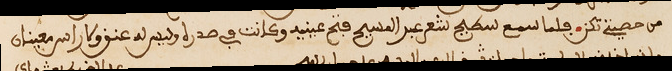من حصتى تكن فلما سمع سطيح شعر عبد المسيح فتح عينيه وكانت في صدره وليس له عنق ولا راس معينان
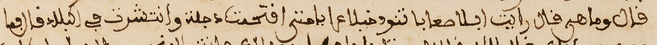قال وما هى قال رايت ابلا صعابا تنود خبلا عرابا حتى اقتحمت دجلة وانتشرت في البلاد قال فما
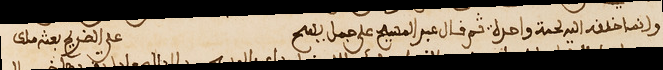وانما خلفه الله لحمة واحدة ثم قال عبد المسيح على جمل يسح على الضريح بعثه ملك
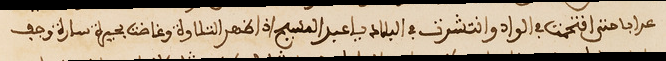عرابا حتى اقتحمت في الواد وانتشرت في البلاد يا عبد المسيح اذا ظهر التلاوة وغاضت بحيرة سارة وجف
